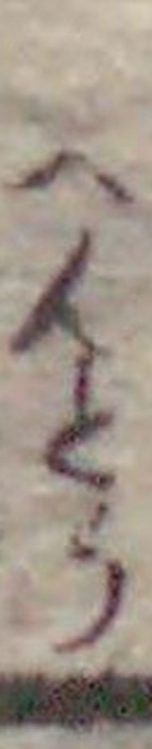へんとう
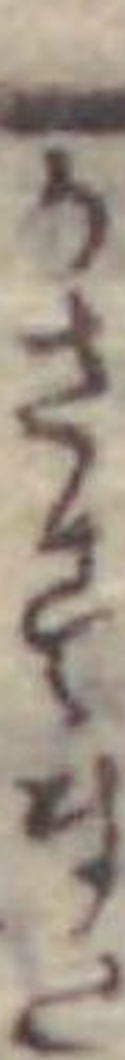かさすまだ
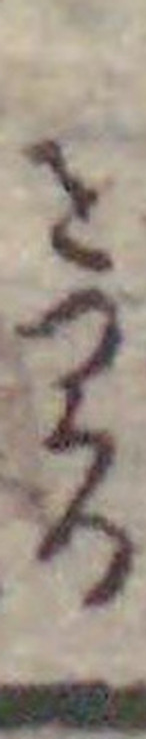をつかう
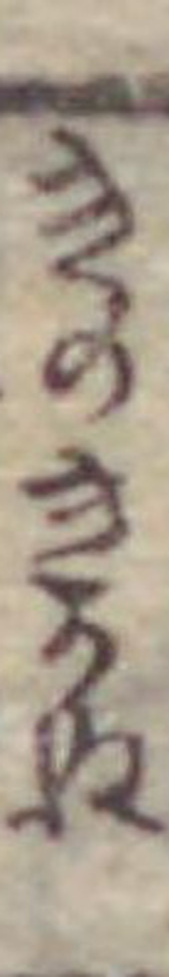きのきかぬ
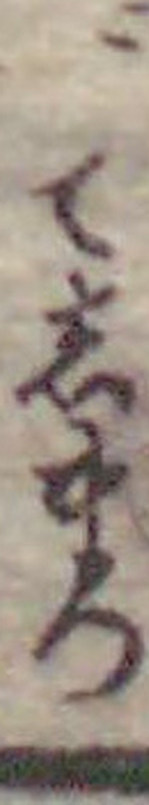てしまつ
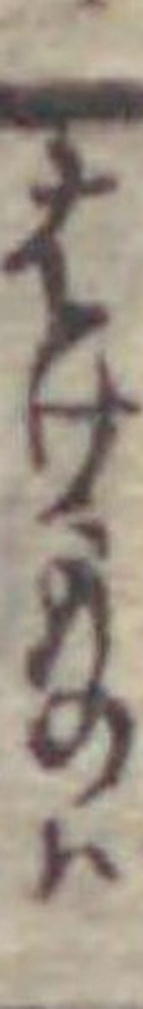はけものは
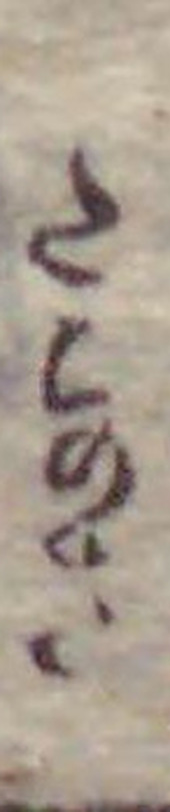たこのさ
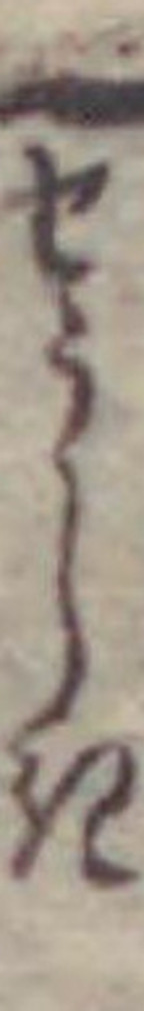せうしき
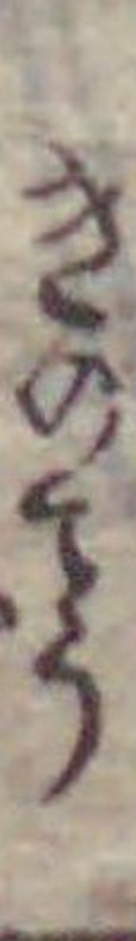きのてう
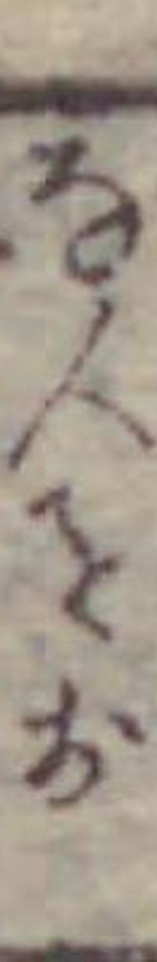な人をお
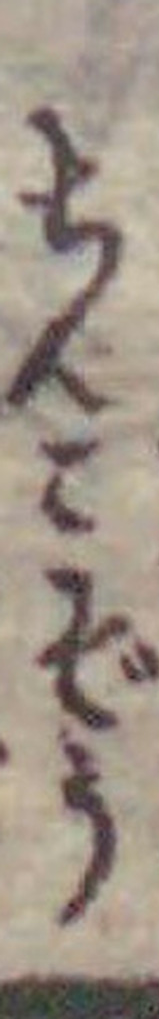ちんこぞう
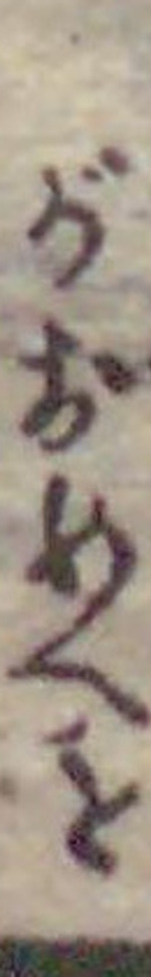がおめへを
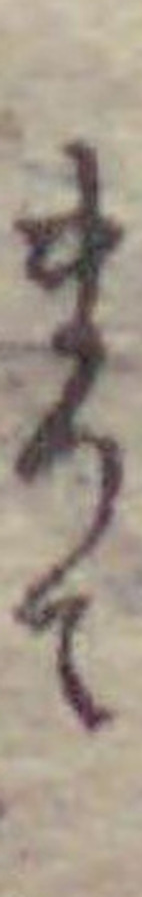まつて
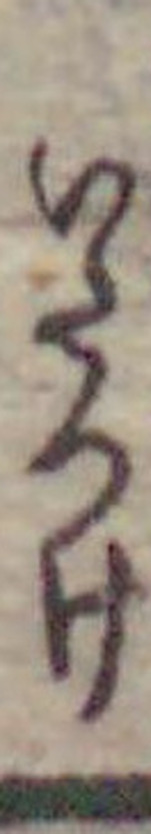いたつけ
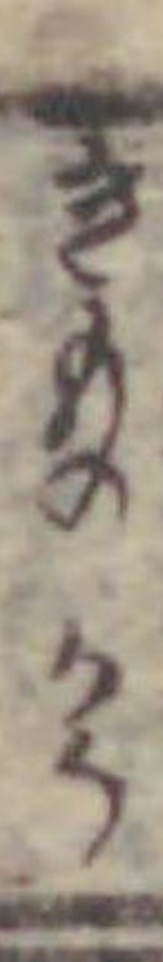きものかう
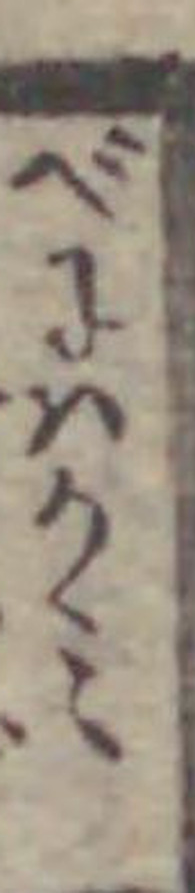べにはかみ
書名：化物見世開 : 2巻
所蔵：国立国会図書館 National Diet Library, JAPAN
